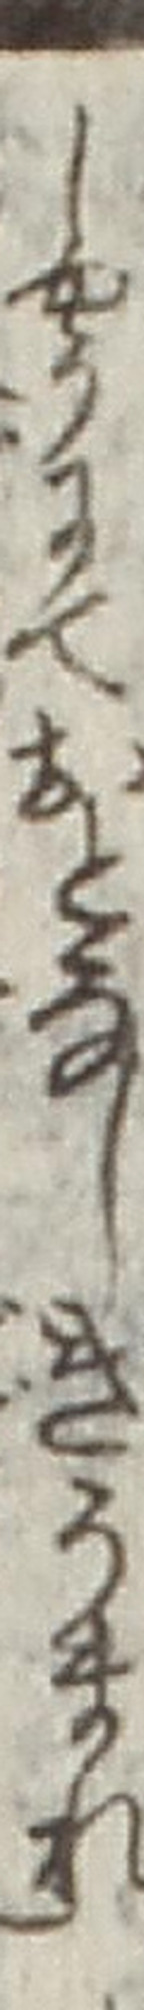しやうにておとなしきうまれ
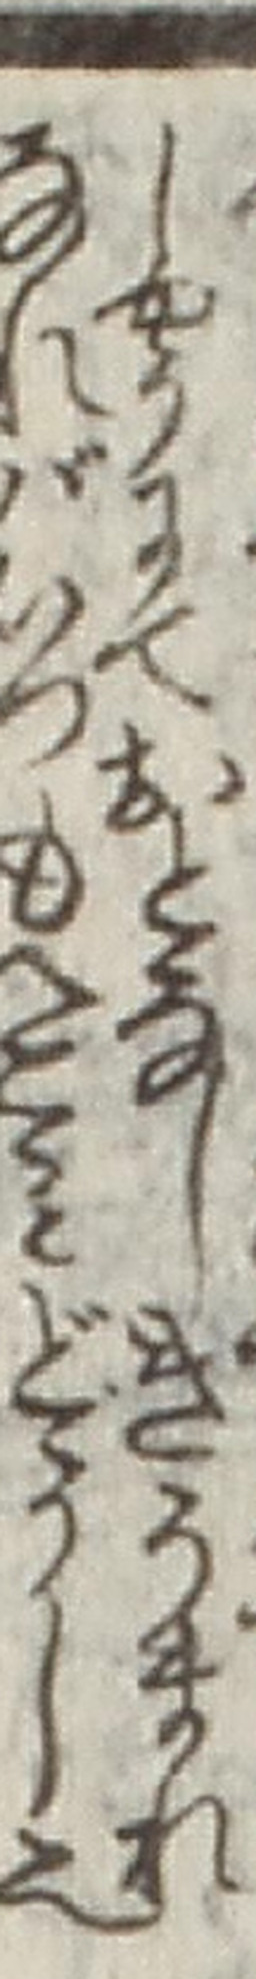なればいつもへこみ？どうし也
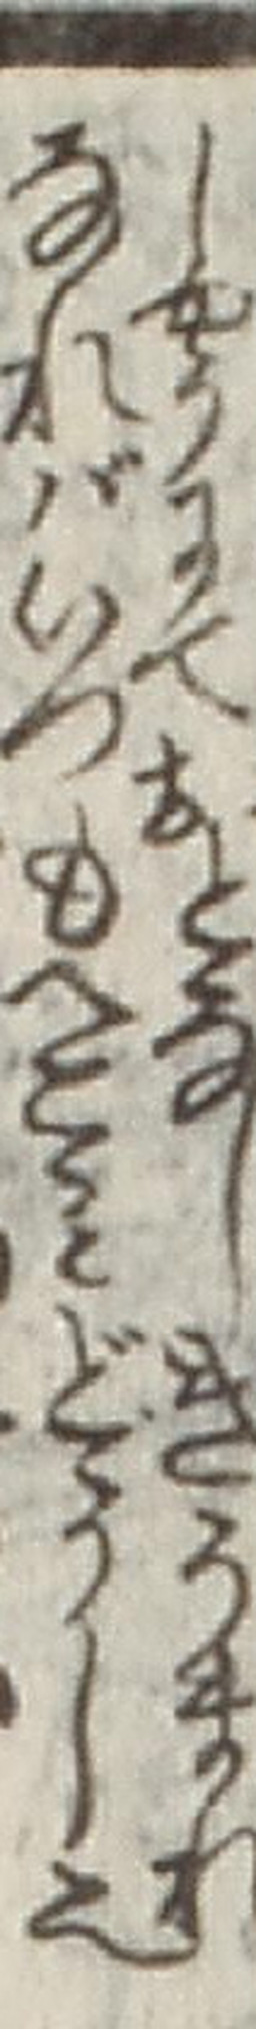なればいつもへこみ？どうし也
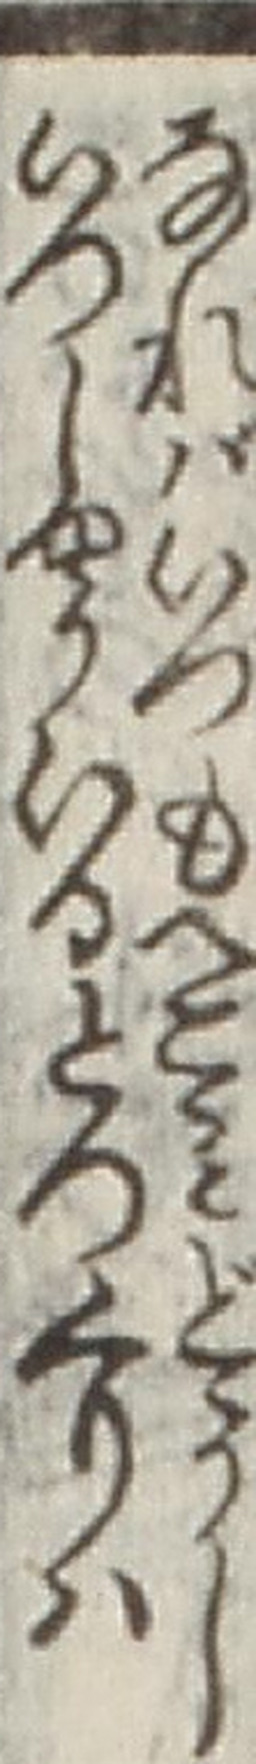いつしやういるとつくりは
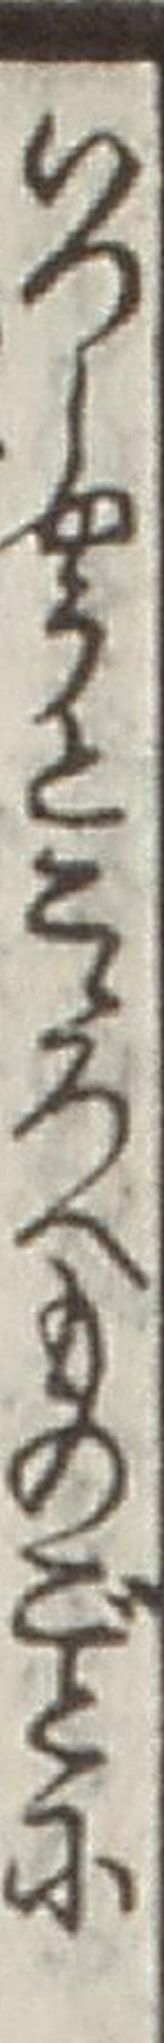いつしやうとこゝろへものごとに
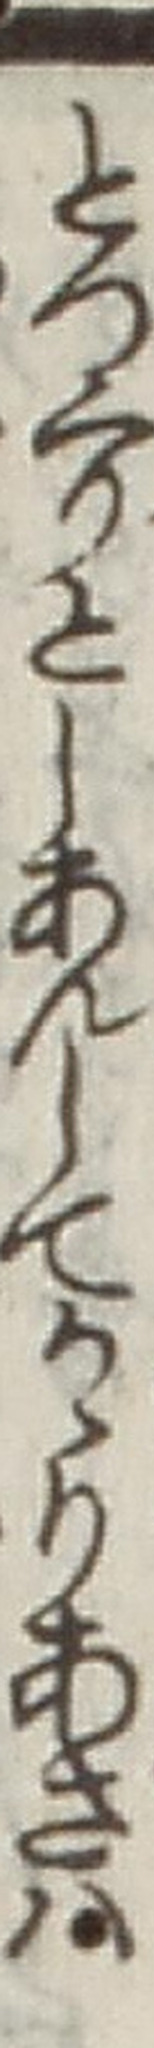とつくりとしあんしてかゝりあさは
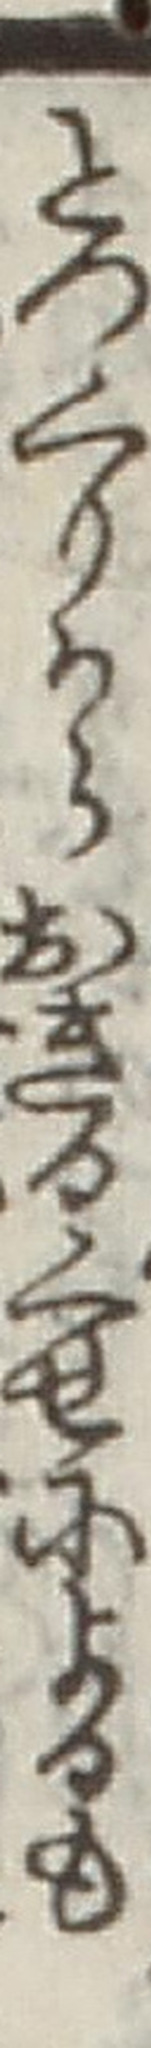とつくりからおきるくせによるも
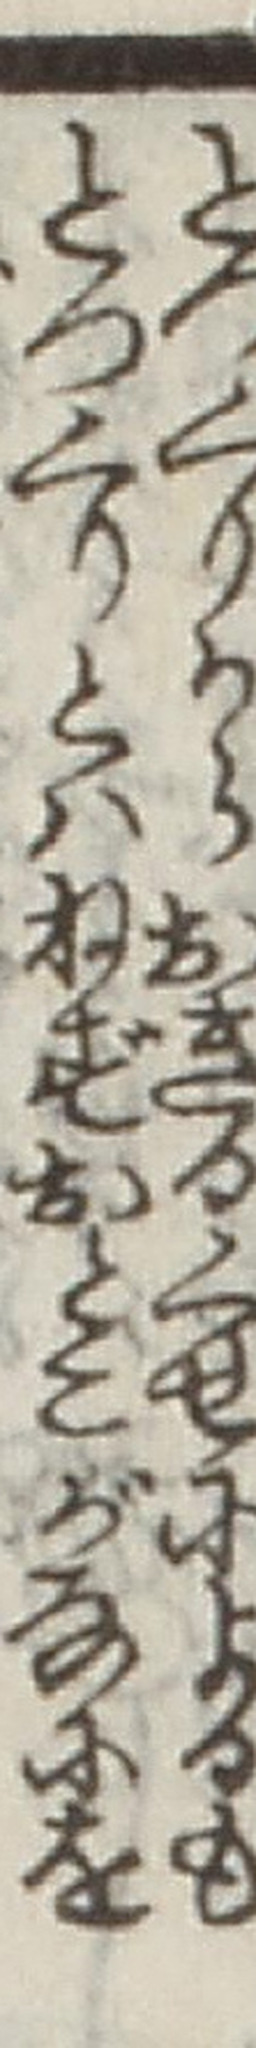とつくりとはねずおとこがなにを
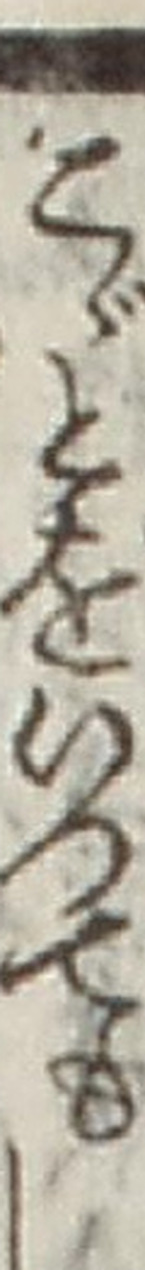こゞとをいつても
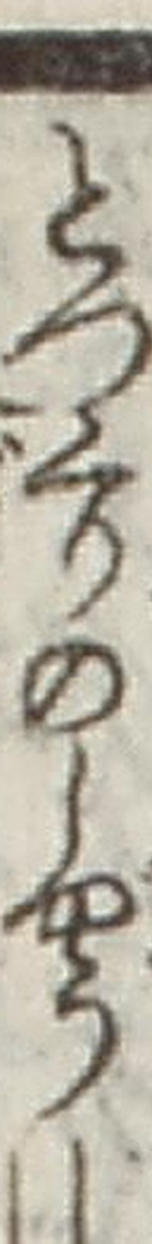とつくりのしやう
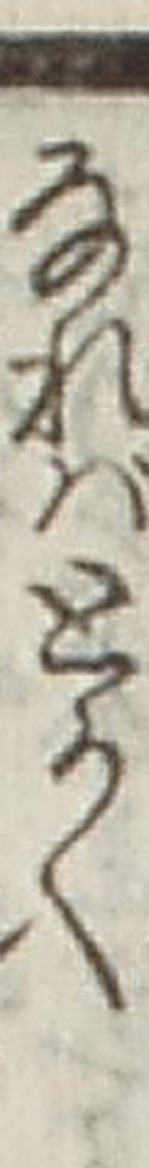なればとかく
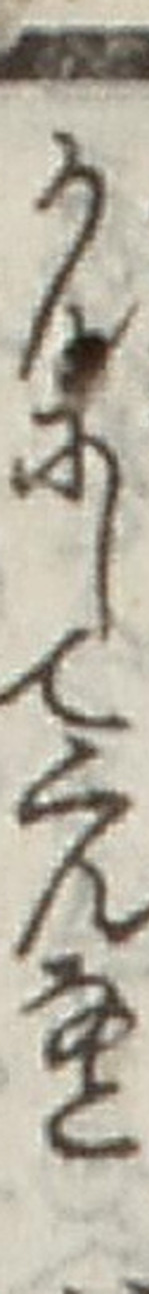かんにしてくんなと
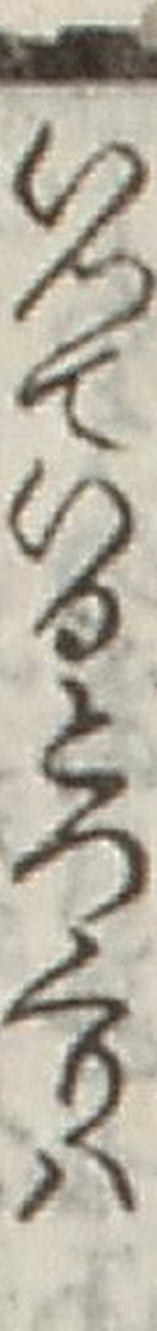いつているとつくりは
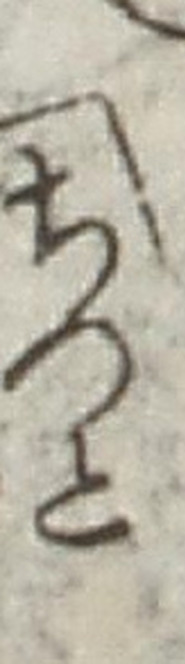〽ちつと
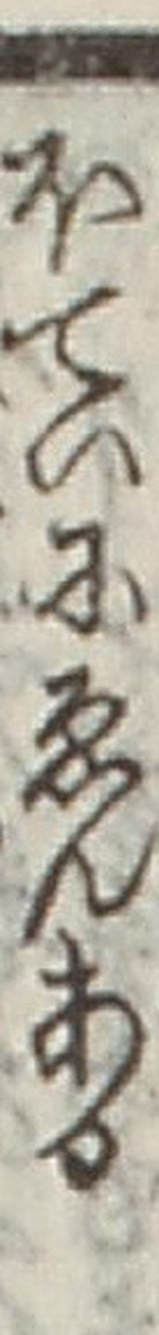ほていにゑんある
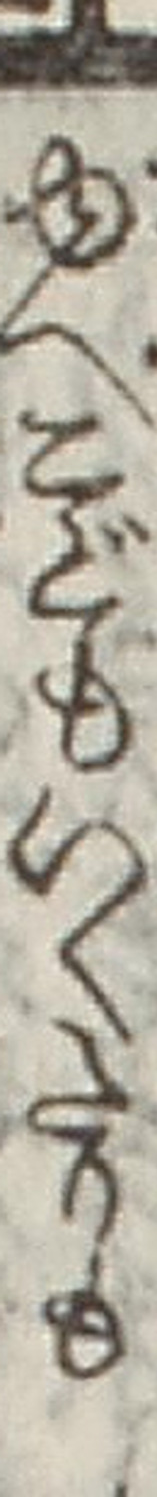ゆへこどものいくたりも
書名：三世相出雲當座帳　上下冊
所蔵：東京大学地震研究所図書室 Earthquake Research Institute Library, The University of Tokyo, JAPAN
